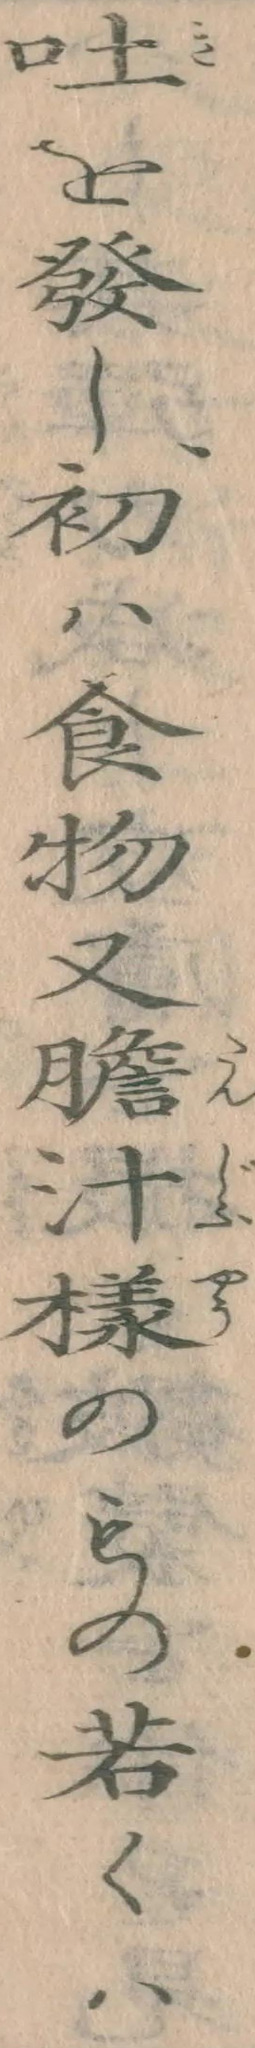吐を発し、初は食物又胆汁様のもの若くは
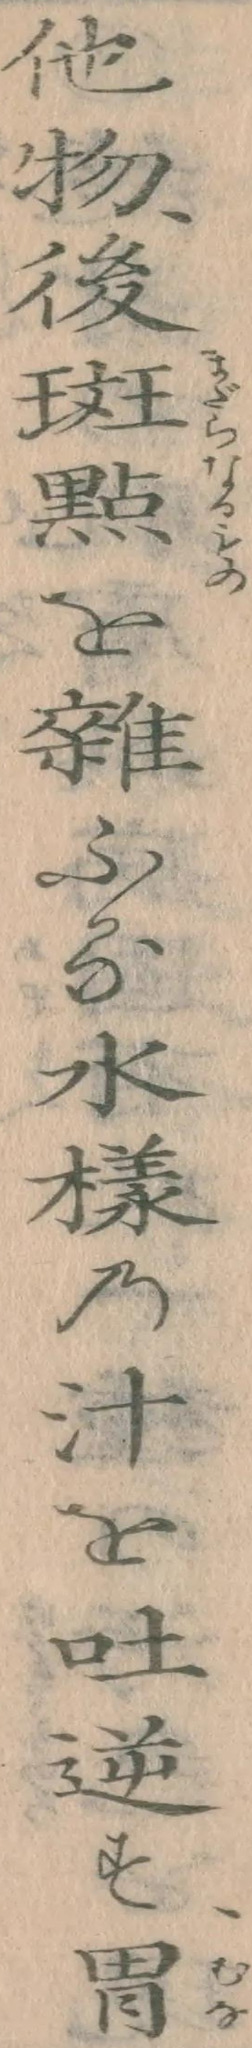他物、後斑点を雑ふる水様の汁を吐逆す、胃
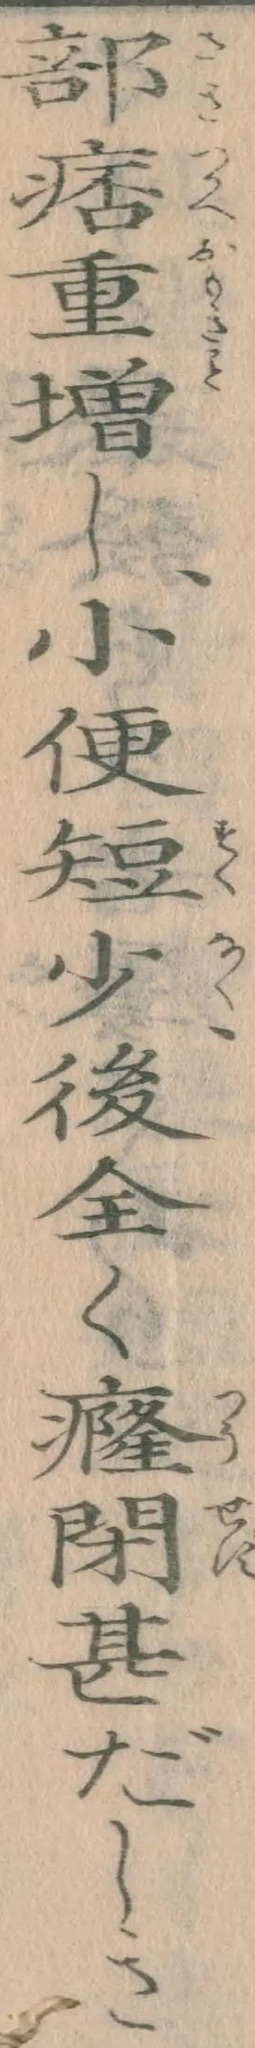部痞重増し、小便短少、後全く癃閉甚だしき
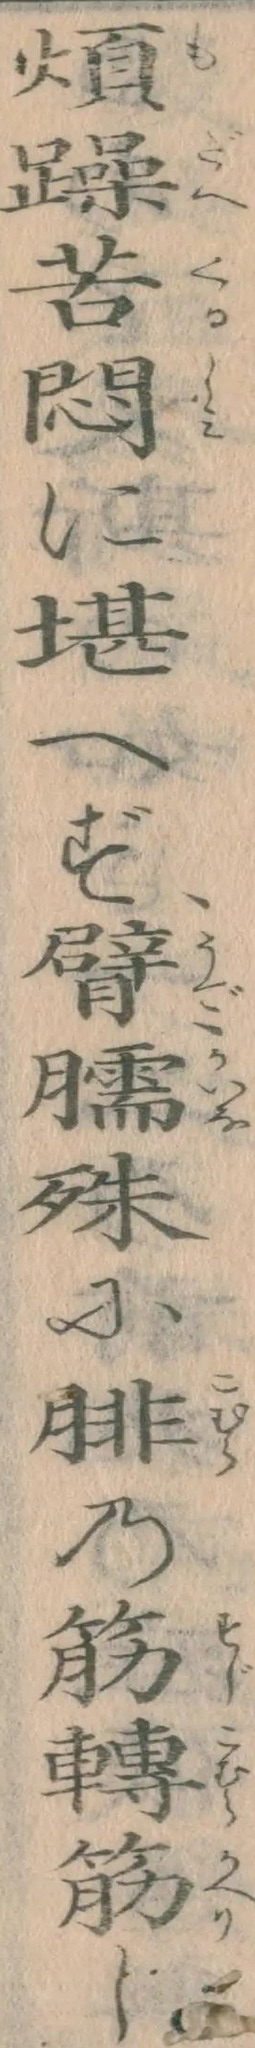煩躁苦悶に堪へず、臂、臑殊に腓の筋転筋し
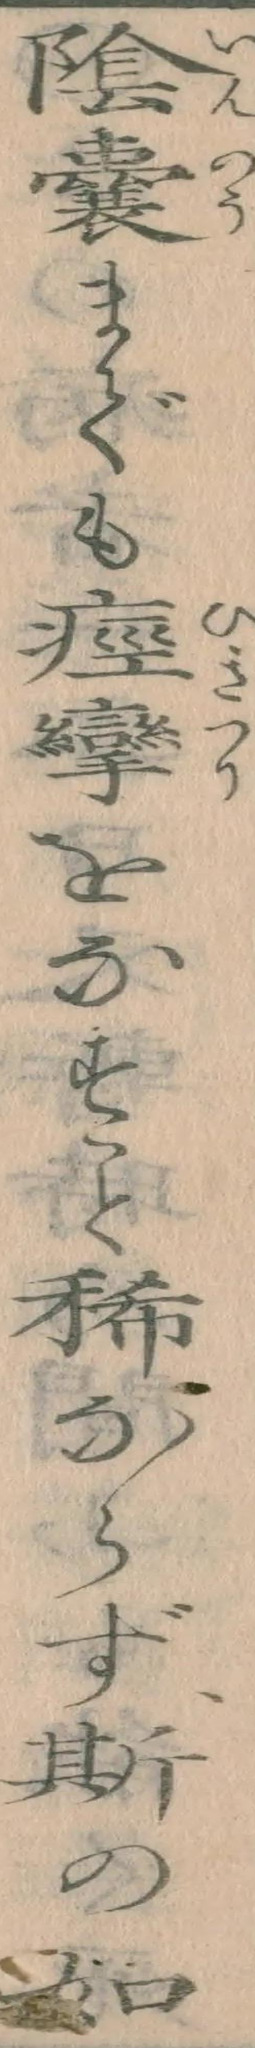陰嚢までも痙攣をなすこと稀ならず、斯の如
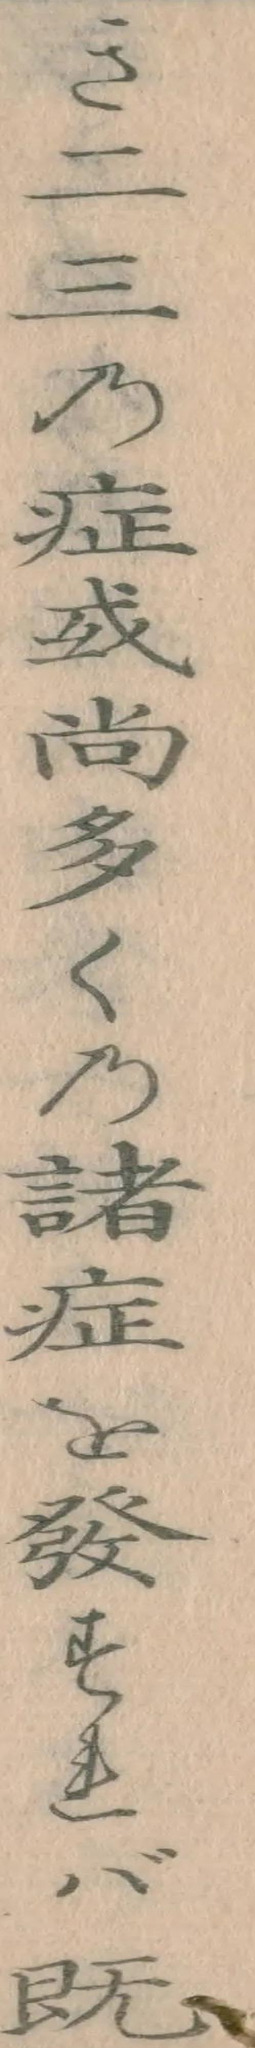き二三の症或尚多くの諸症を発すれば既
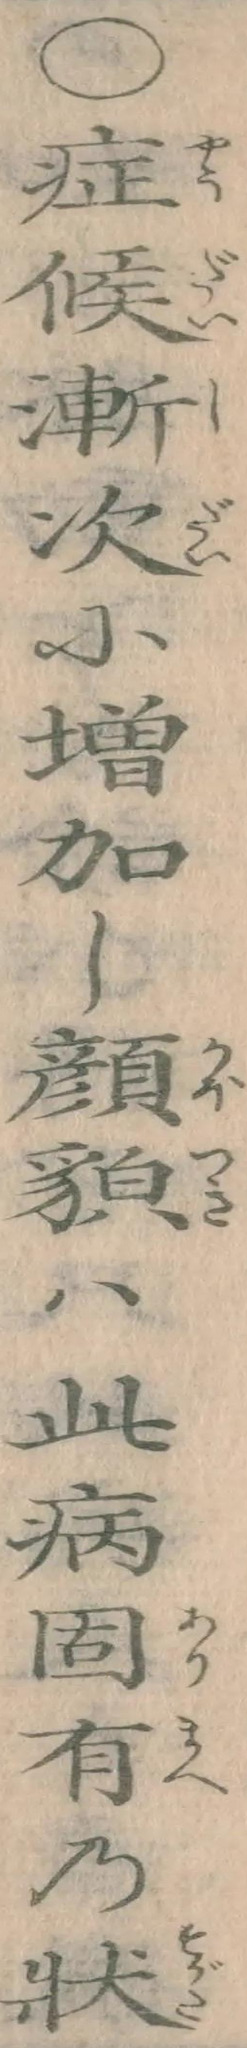〇症候漸次に増加し顔貌は此病固有の状
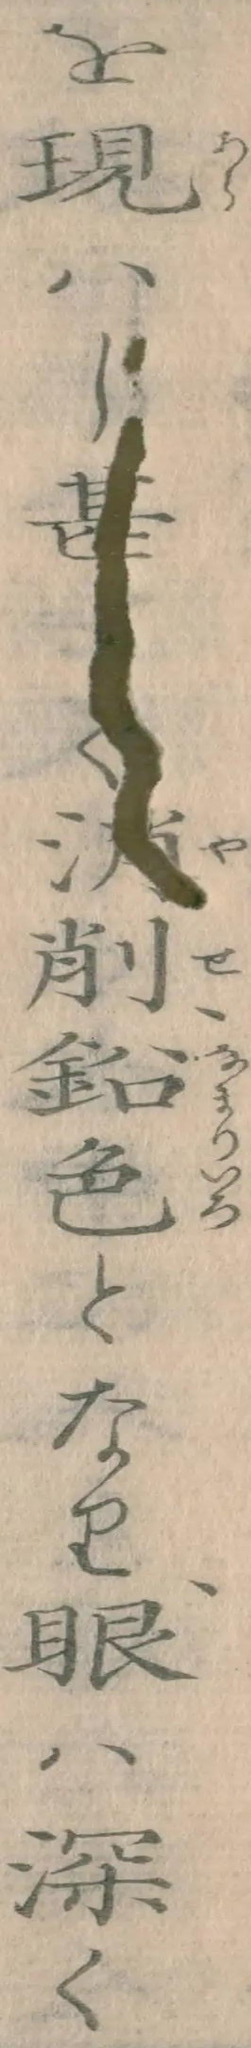を現はし甚▢く消削、鉛色となり、眼は深く

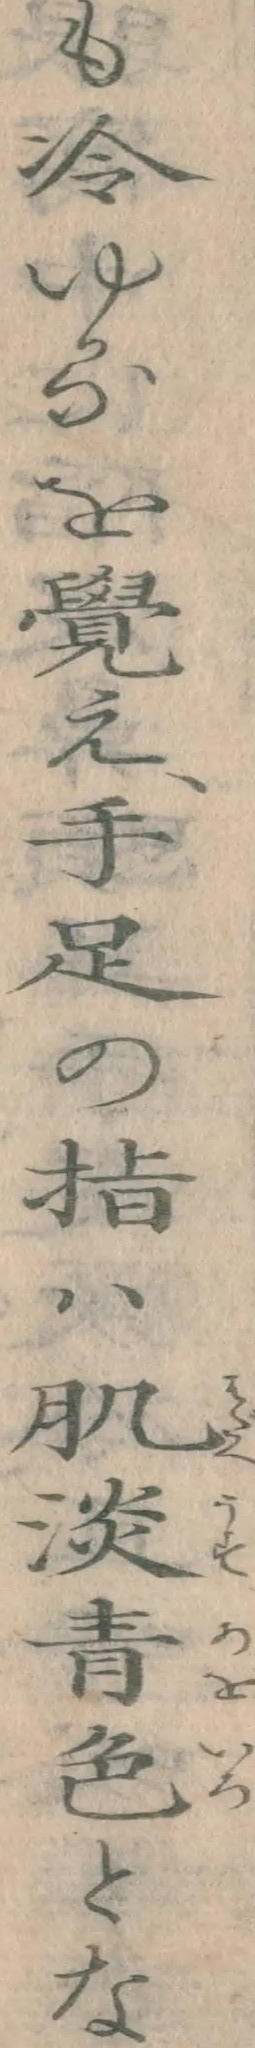も冷ゆるを覚え、手足の指は肌淡青色とな
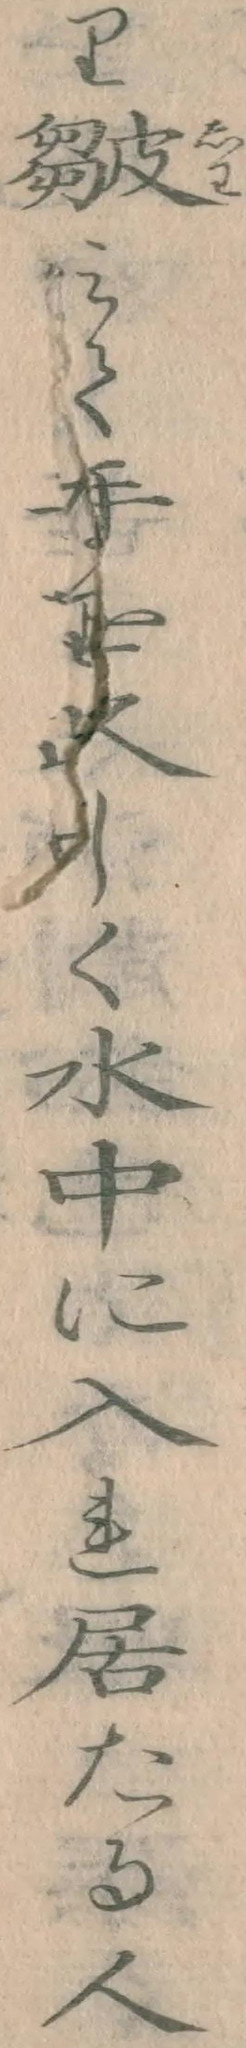り皺みて手を久しく水中に入れ居たる人
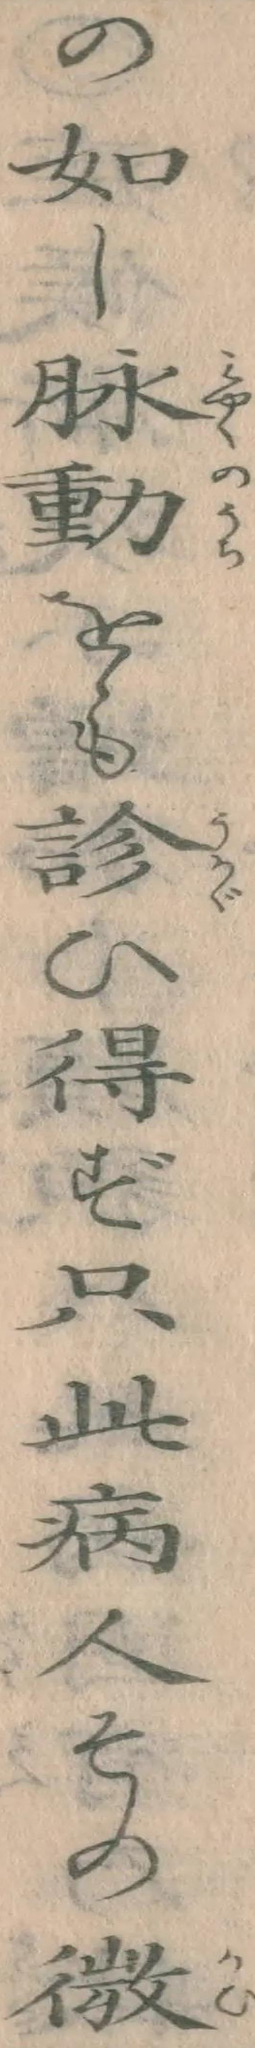の如し脉動をも診ひ得ず只此病人その微
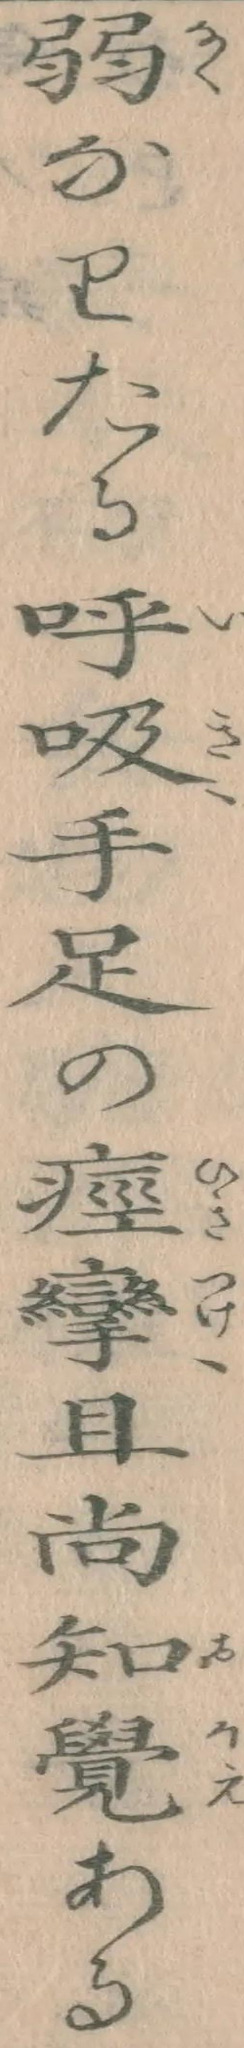弱なりたる呼吸、手足の痙攣、且尚知覚ある
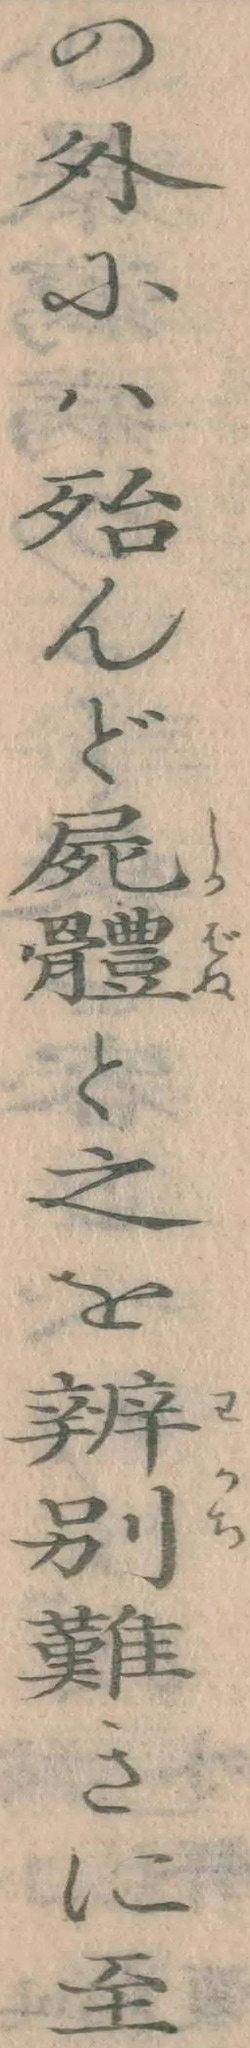の外には殆んど屍体と之を弁別難きに至
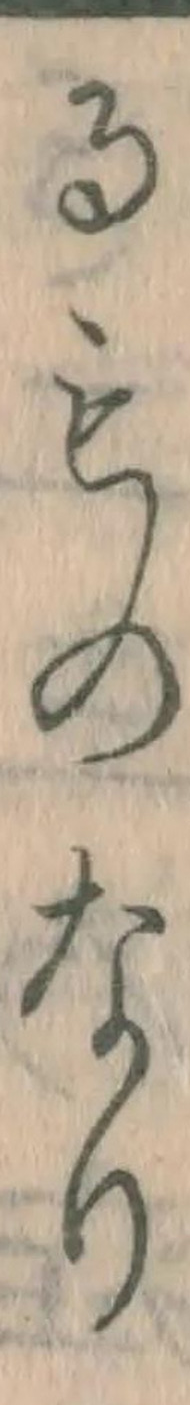るものなり
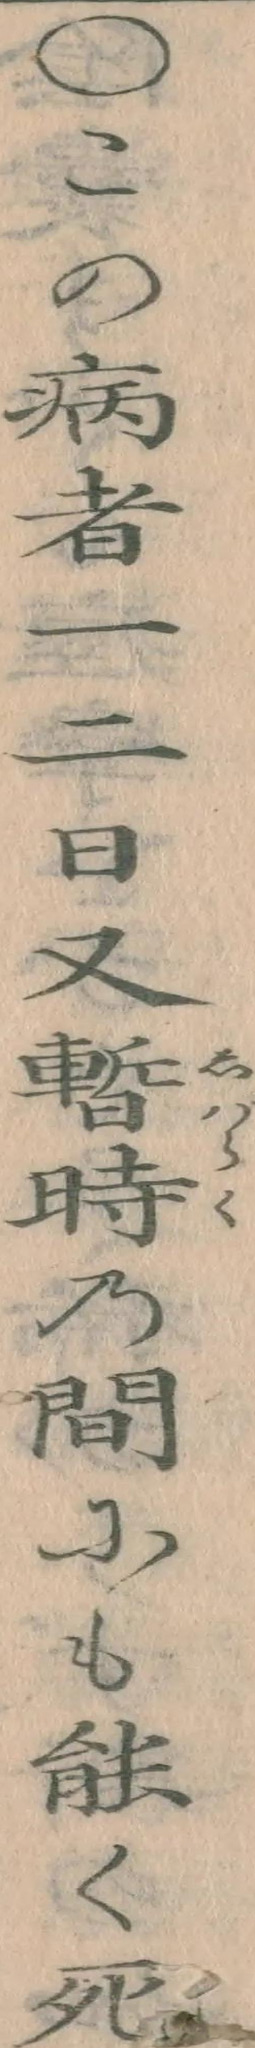〇この病者一二日又暫時の間にも能く死
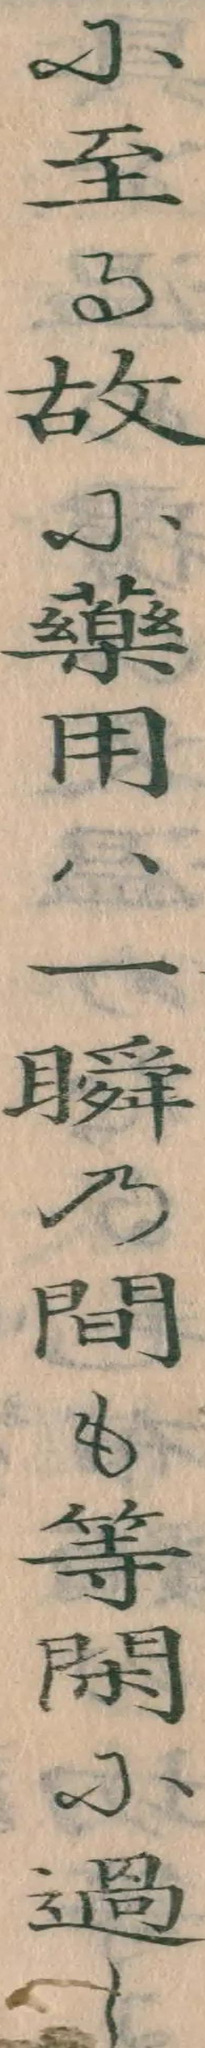に至る故に薬用は一瞬の間も等閑に過し
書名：暴瀉病手当素人心得書
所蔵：国立国会図書館 National Diet Library, JAPAN
